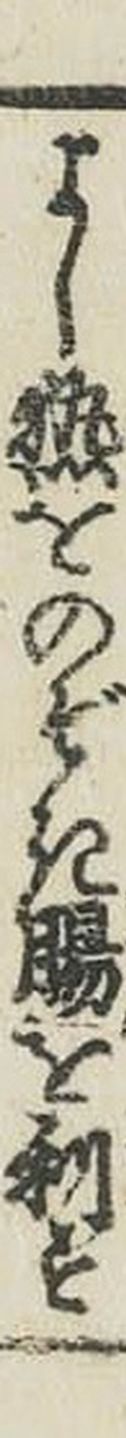よし熱をのぞき腸を利す
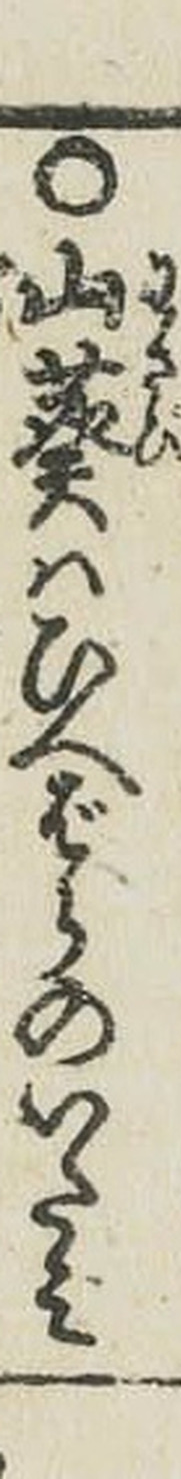○山葵はひへばらのいたみ
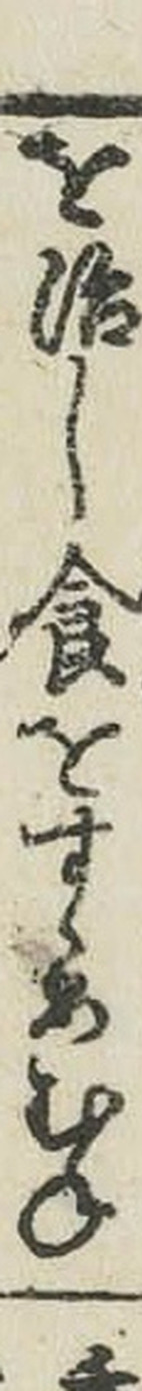を治し食をすゝめむね
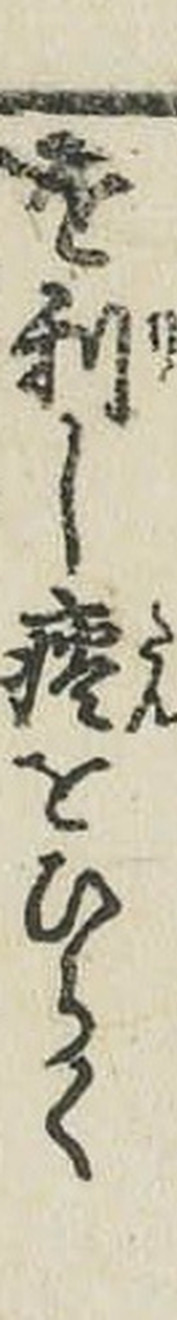を利し痰をひらく
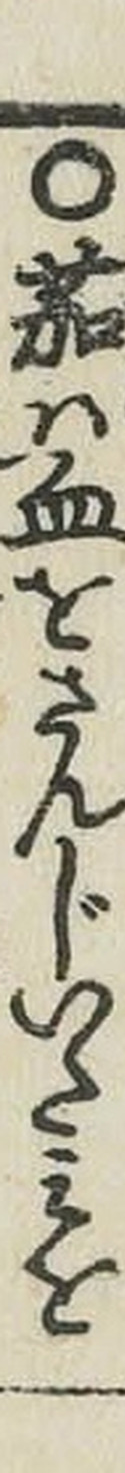○茄は血をさんじいたみを
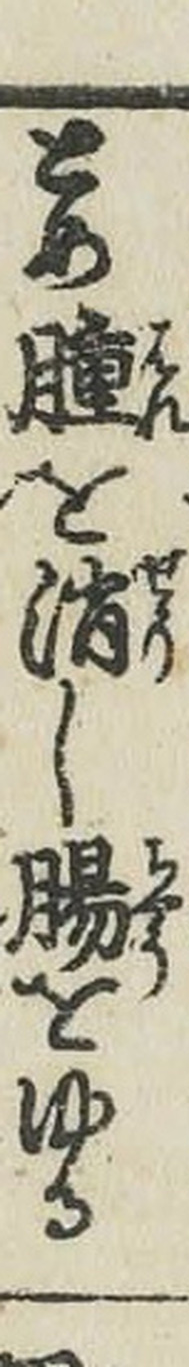とめ腫を消し腸をゆる
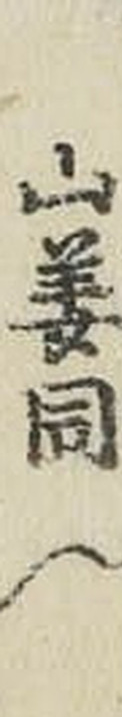山姜同
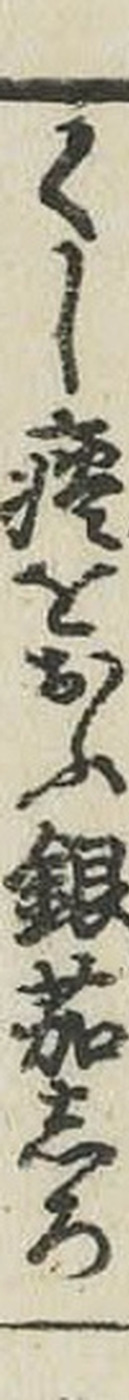くし痰をおふ銀茄しろ
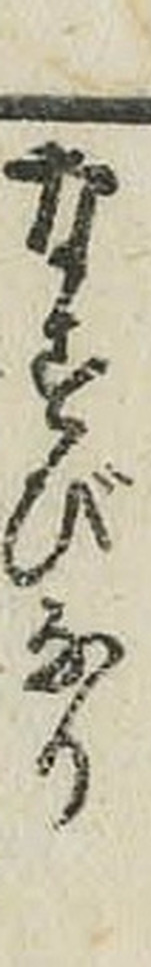なすびなり
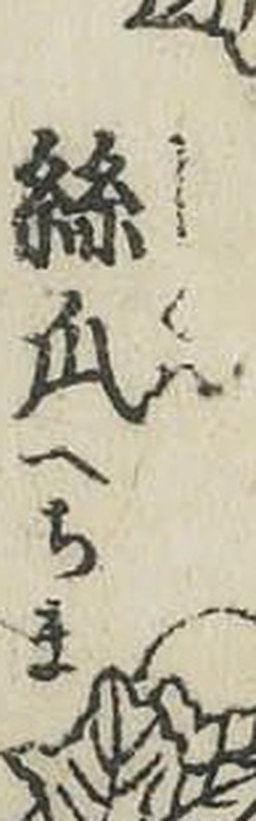絲瓜へちま
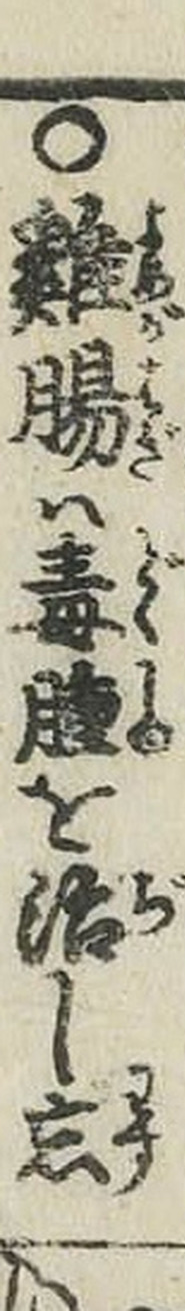○鶏腸は毒腫を治し忘
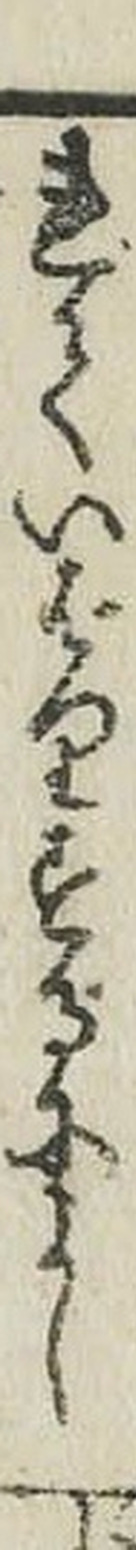れていばりするによし
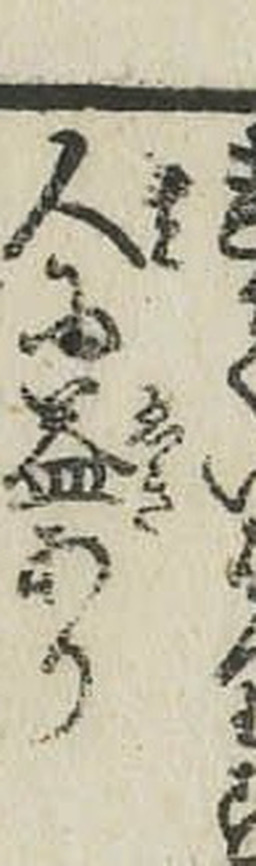人に益あり
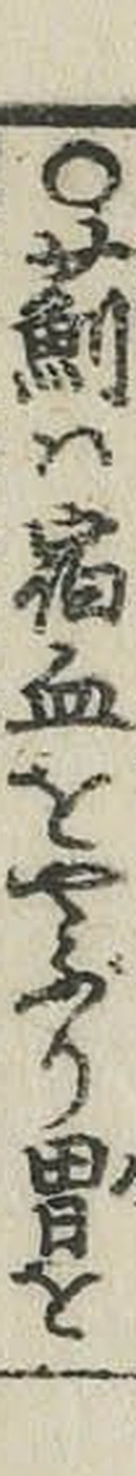○薊は宿血をやぶり胃を

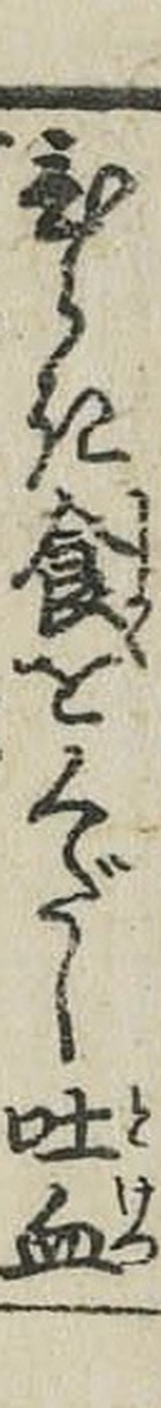ひらき食をくだし吐血
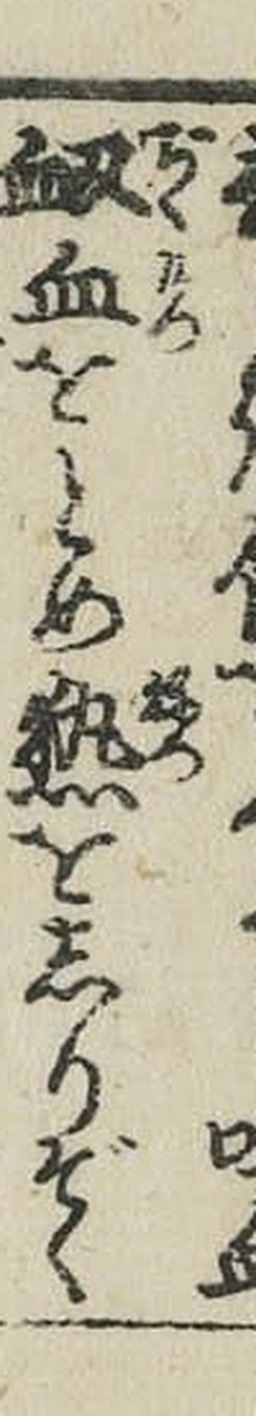衂血をとめ熱をしりぞく
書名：増補頭書訓蒙図彙大成 10巻 8:巻之17-19
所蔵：東京学芸大学教育コンテンツアーカイブ
